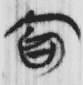○（拘）
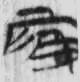雇
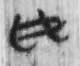女
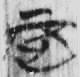○（返）
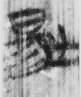塲
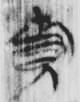賈
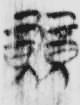競
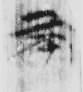不
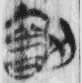割
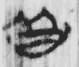皆
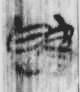既
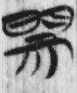○（盟）
